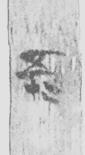五十=
